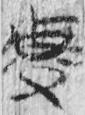弁
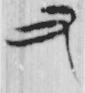又
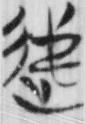递
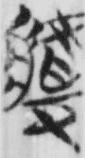○（瘥）
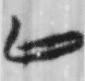㠯
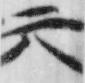亓
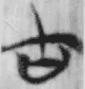古
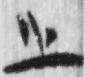之
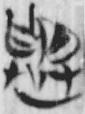○（舉）
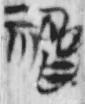禱
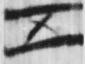五
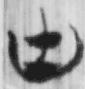山
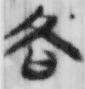各
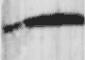一
